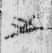之
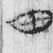田
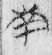南
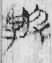與
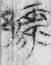录
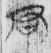君
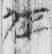距
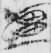疆
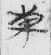東
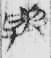與
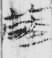陵
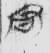君
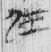距
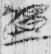疆
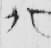北
